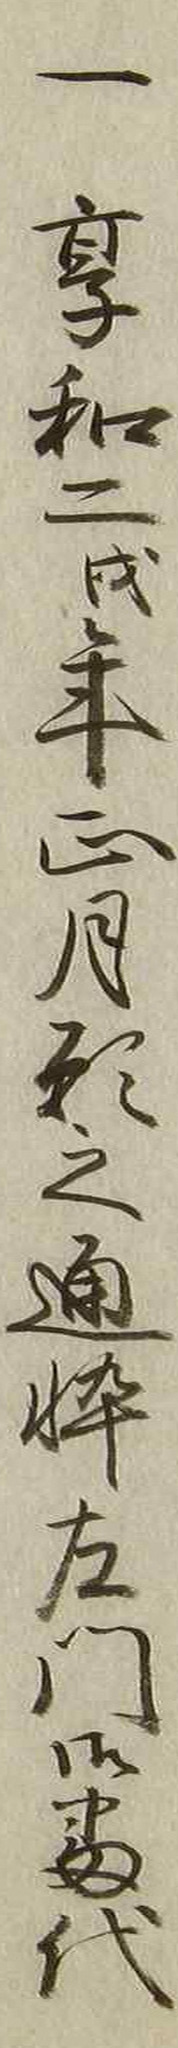一享和二戊年正月願之通忰左門御番代
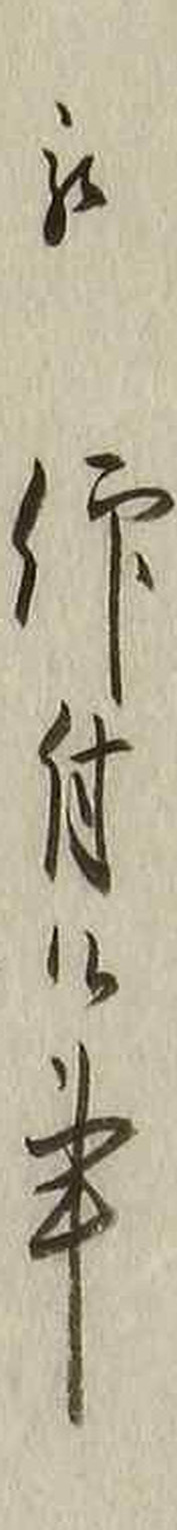被仰付候事
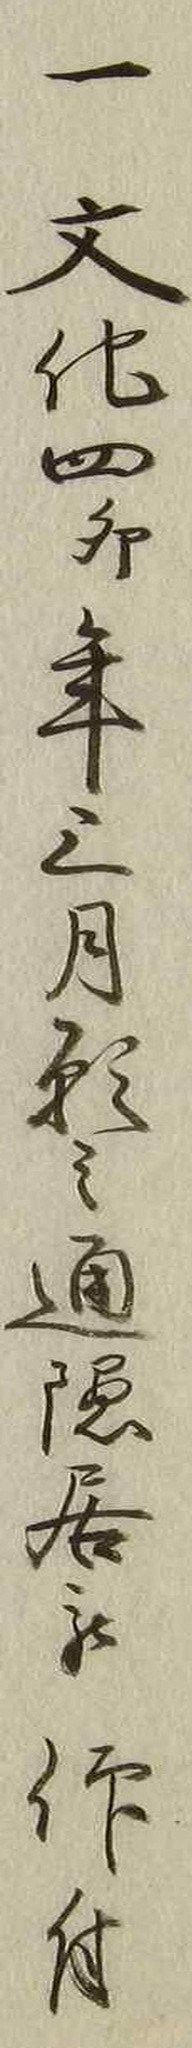一文化四卯年三月願之通隠居被仰付
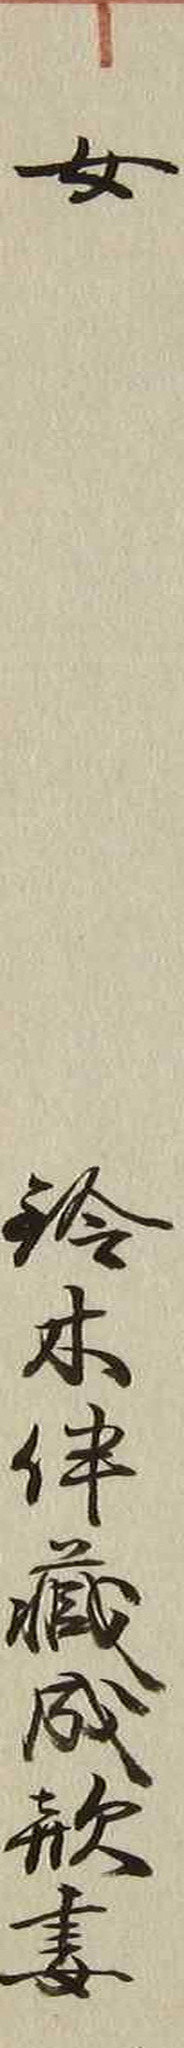女鈴木伴蔵成喜妻
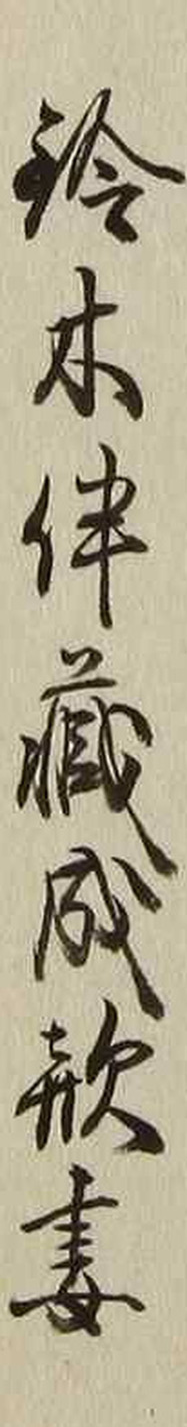女鈴木伴蔵成喜妻
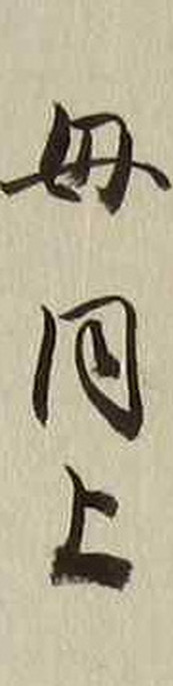母同上
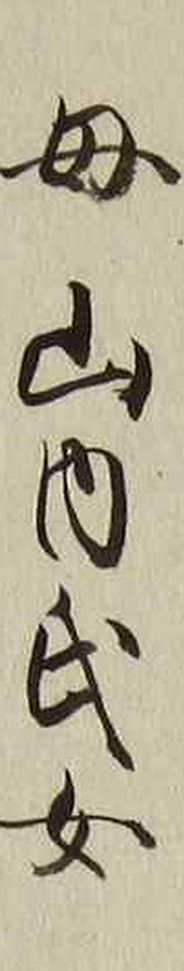母山内氏女
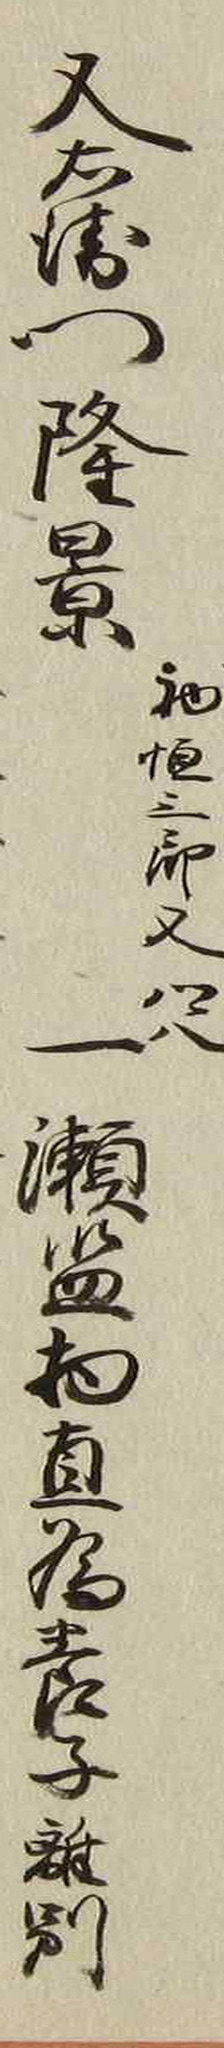又右衛門隆景一瀬監物直為養子離別
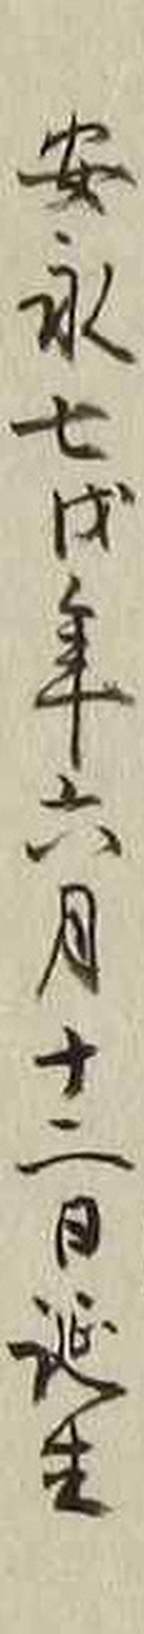安永七戌年六月十二日誕生
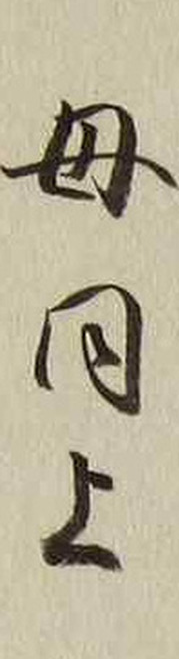母同上
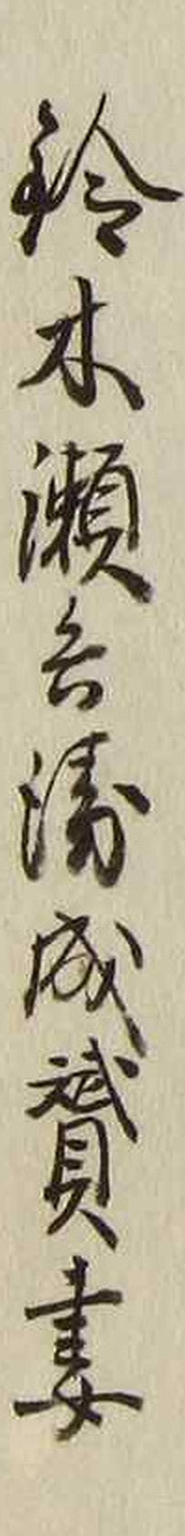女鈴木瀬兵衛成贇妻
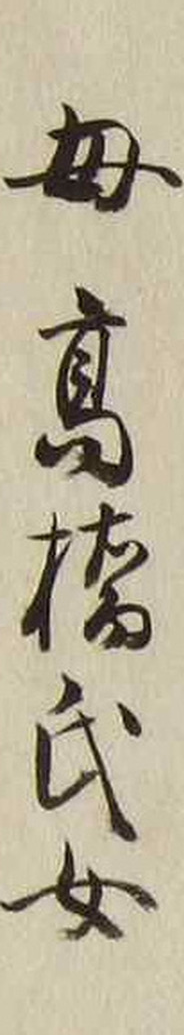母高橋氏女

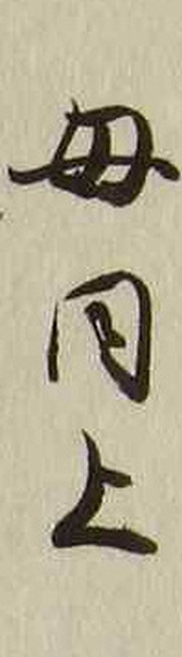母同上
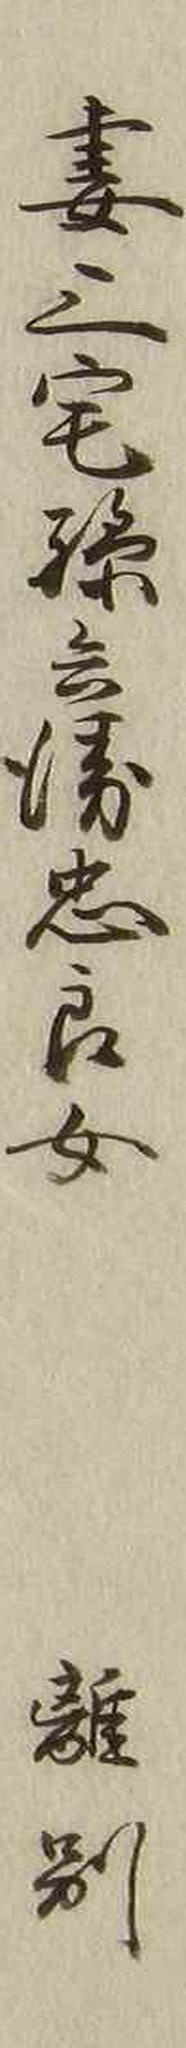妻三宅孫兵衛忠良女離別
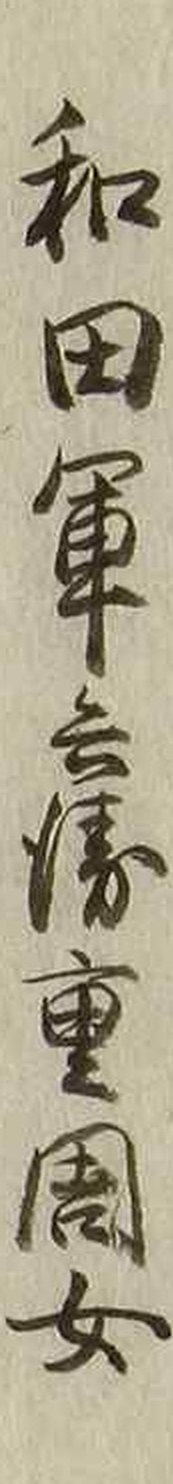和田軍兵衛重周女
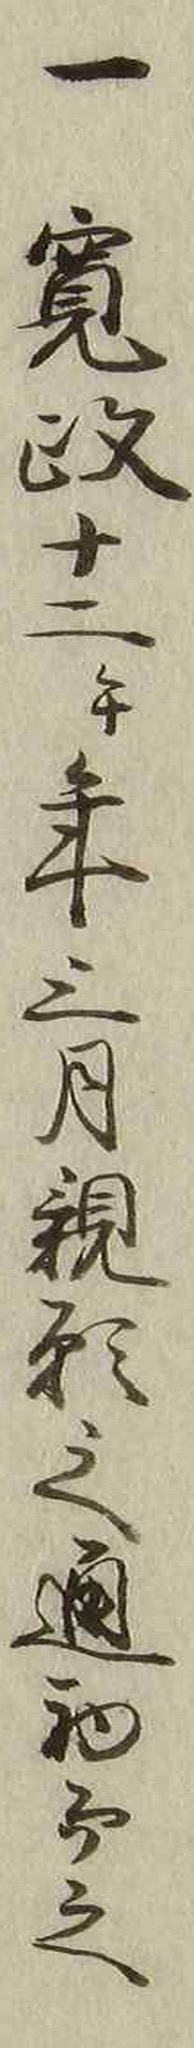一寛政十二午年三月親願之通初而之
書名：諸士系譜　巻之15　い之部15
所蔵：会津若松市立会津図書館
